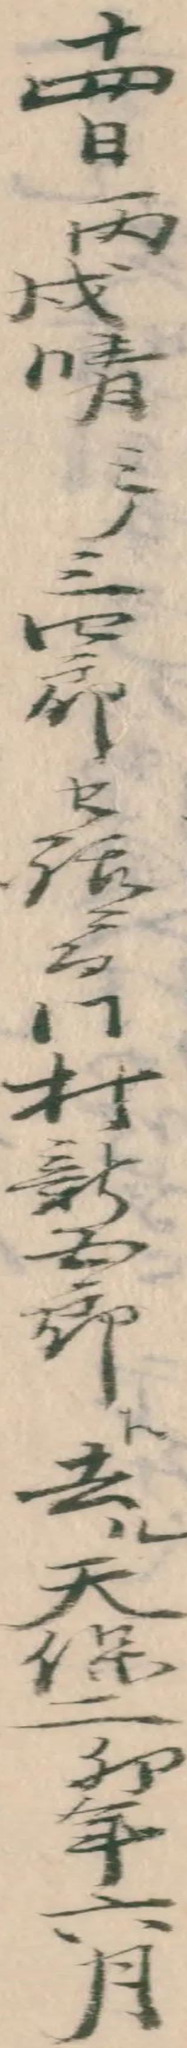十四日丙戌晴ニテ三四郎世話ニ而同村新五郎え去ル天保二卯年六月
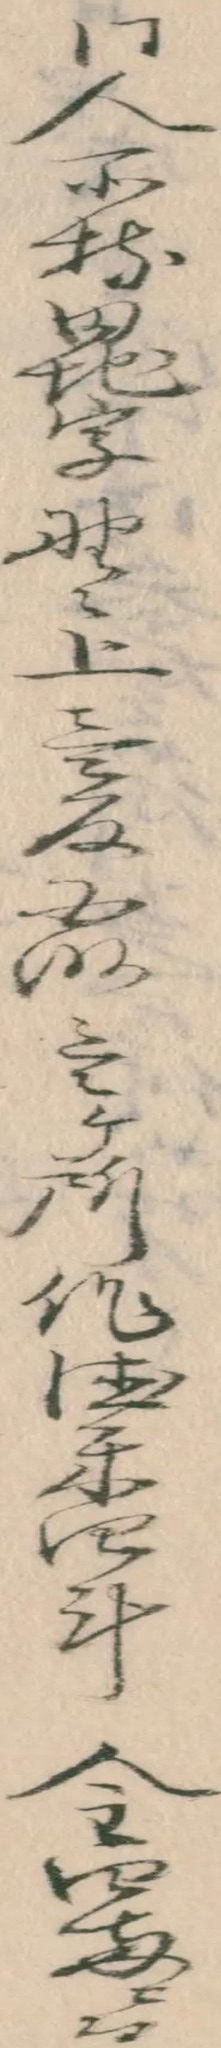同人所持田地字野〻上壱反五畝壱ケ所作徳米四斗金四両ニ而
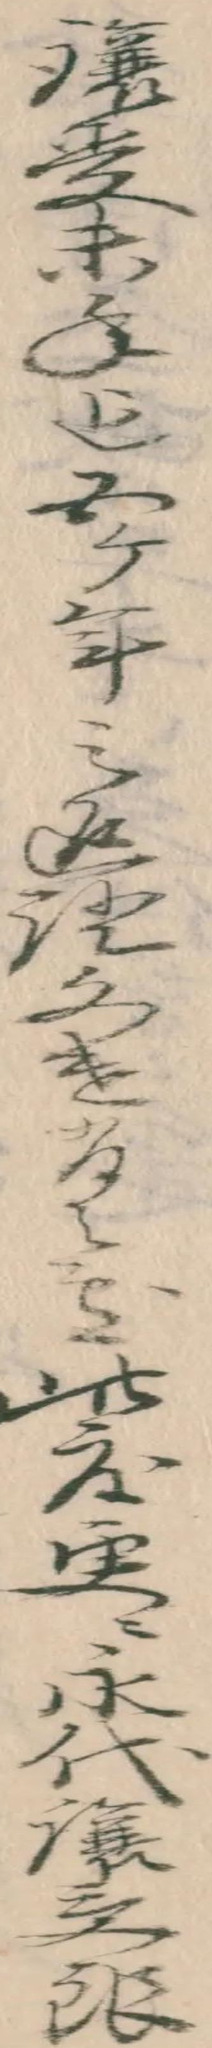譲受未年迄五ヶ年之返證文遣有之處此度更ニ永代譲受銀
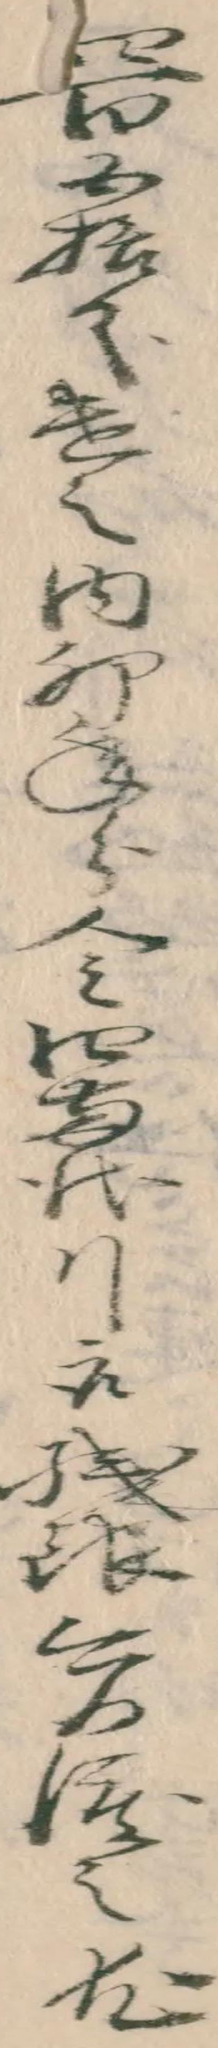四百五拾匁遣之内卯年分金四両代引取残銀今日渡之尤
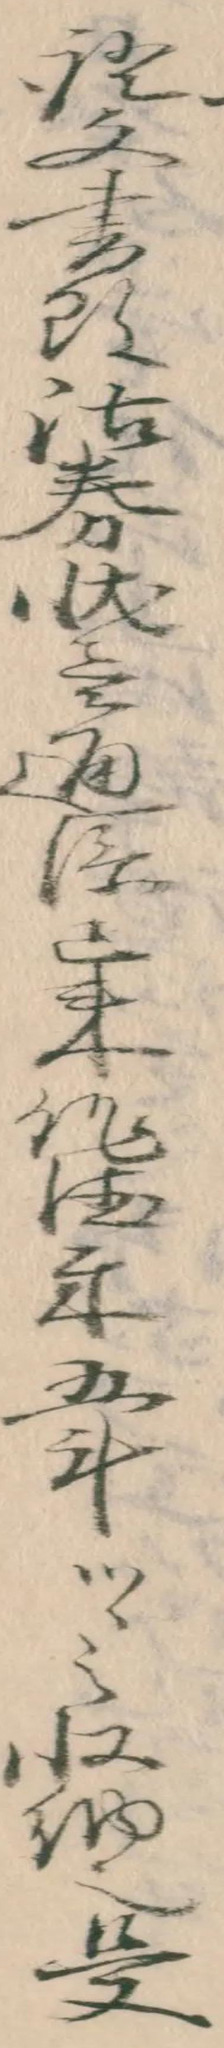證文書改沽券状壱通添已来作徳米五斗ツヽ之収納也且又
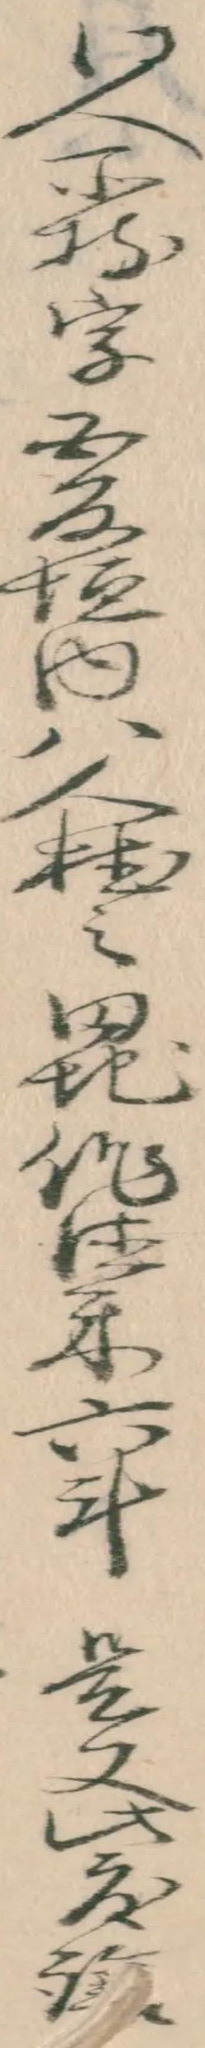同人所持字五反垣内八人植之田地作徳米六斗是又此度譲
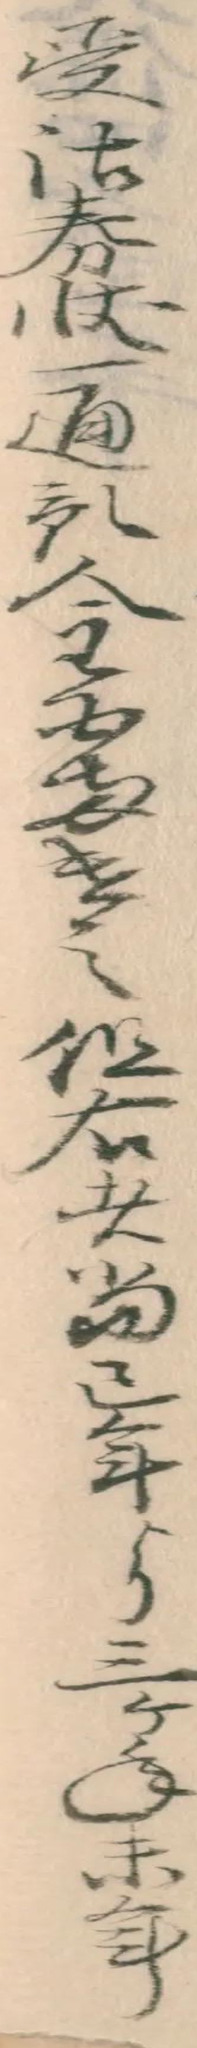受沽券状一通預金五両遣之但右者當巳年より三ケ年未年
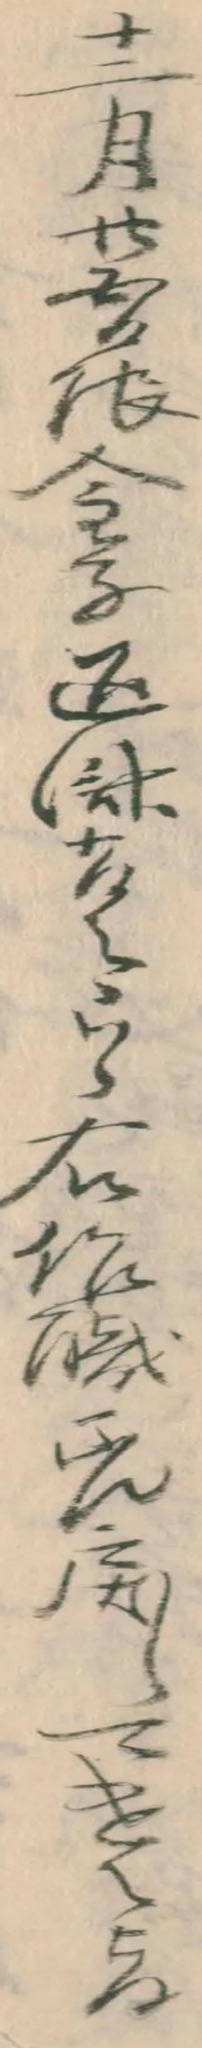十二月廿五日限金子退済有之候はヽ右作職差戻し可遣之旨
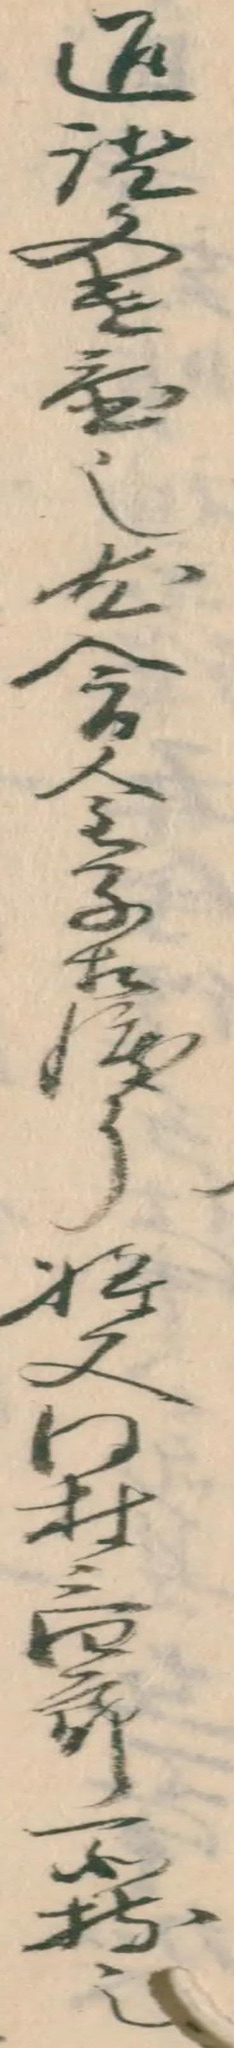返證文遣置也尤今日金子相渡了将又同村三四郎所持之
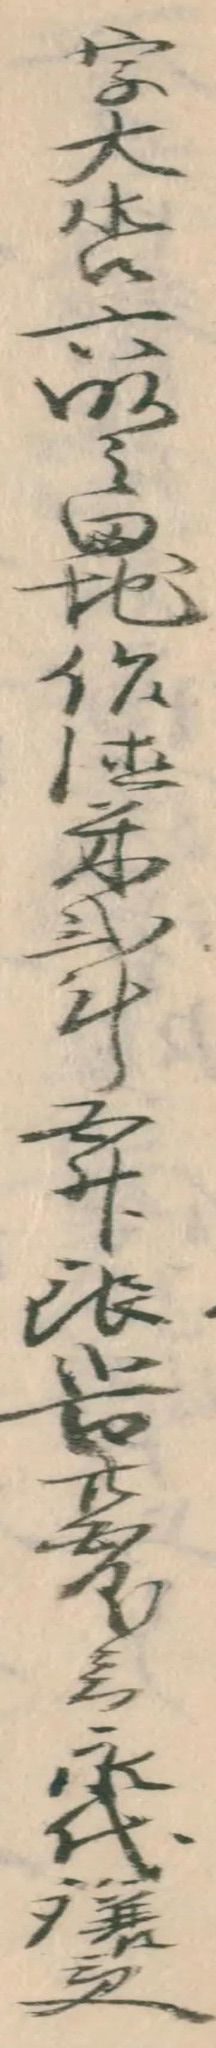字大水口六畝之田地作徳米弐斗五升銀弐百廿五匁ニ而永代譲受
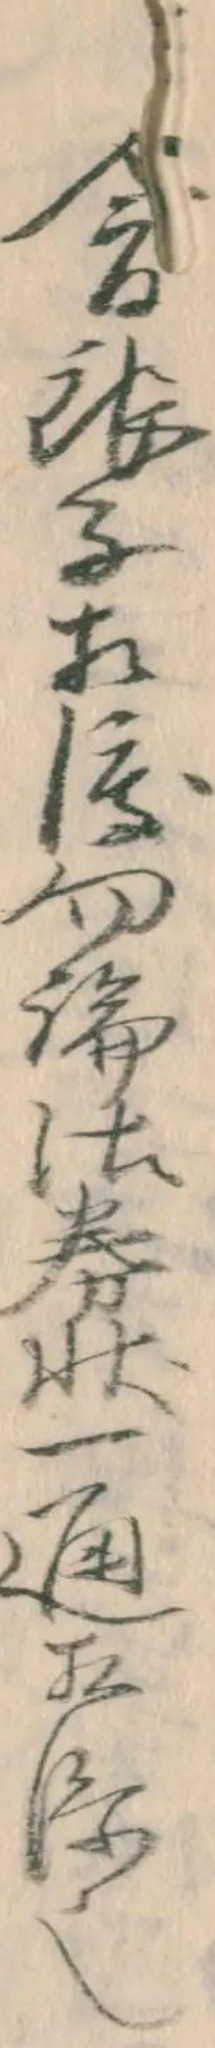今日銀子相渡勿論沽券状一通相添也
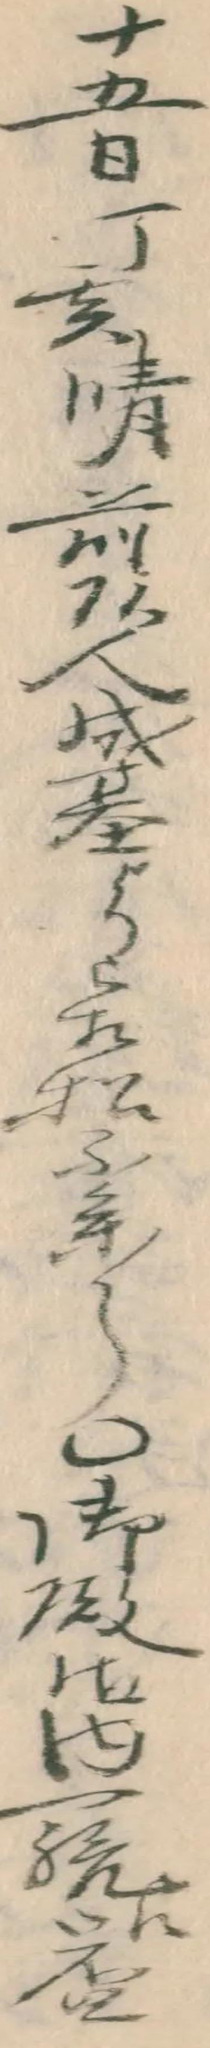十五日丁亥晴前頭人成基より被相招不参了〇御殿御内一統え御盃
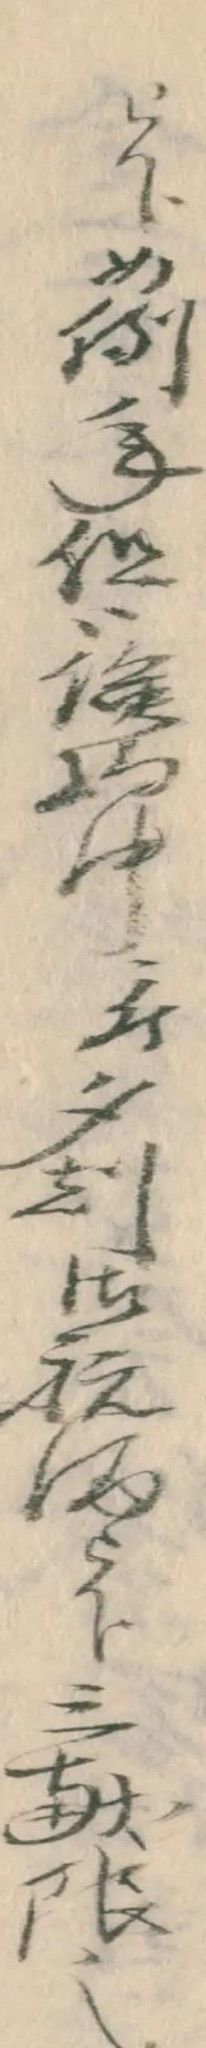被下如例年但御倹約中ニ付夕刻御祝酒被下三献限也
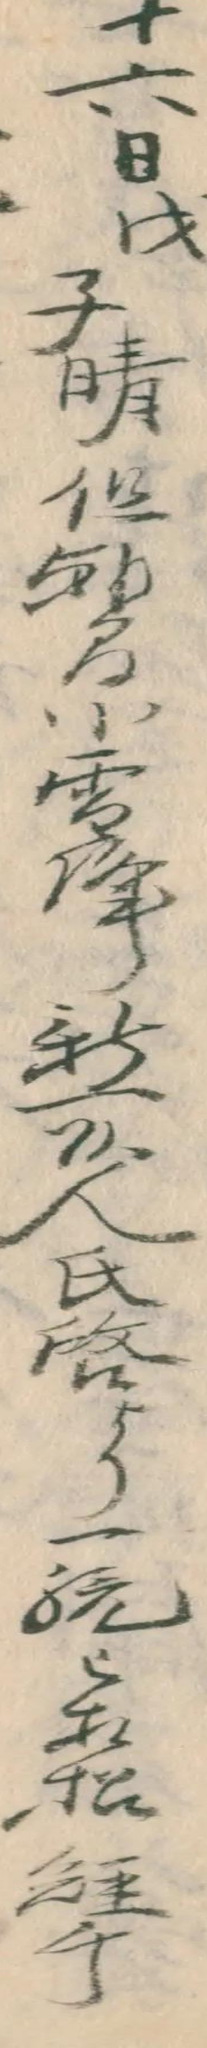十六日戊子晴但朝間小雪降新一頭人民啓より一統被相招経千
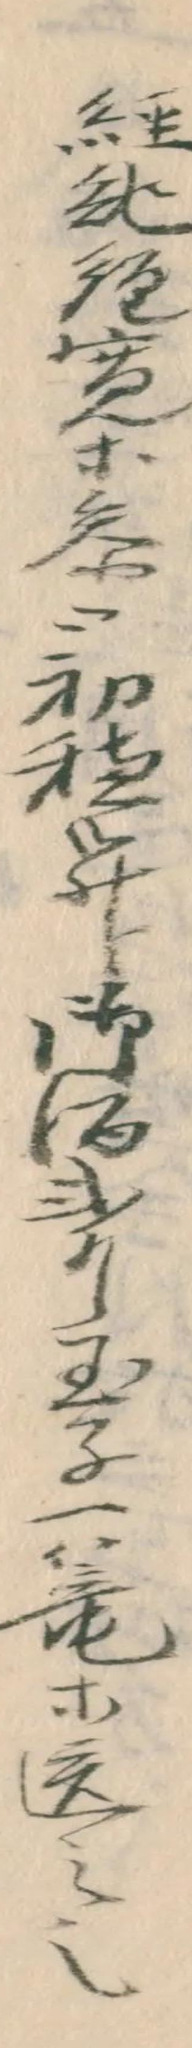経紀経寛等参御初穂弐升御酒弐升玉子一篭等送之
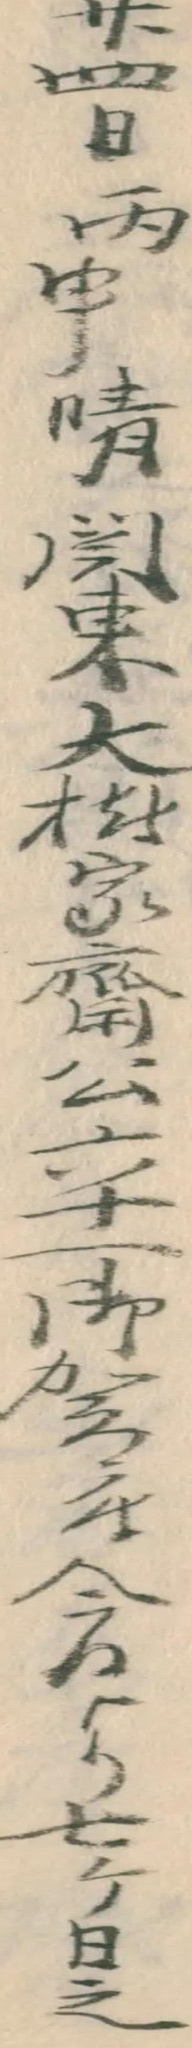廿四日丙申晴関東大樹家齋公六十一御賀ニ付今日より七ヶ日之
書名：賀茂社記録. 第66冊
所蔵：国立国会図書館 National Diet Library, JAPAN
